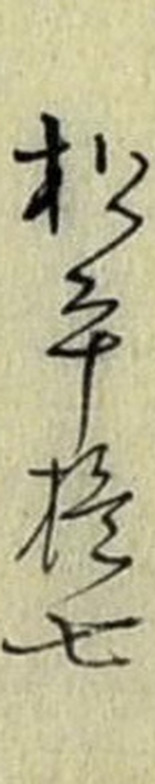松平権七
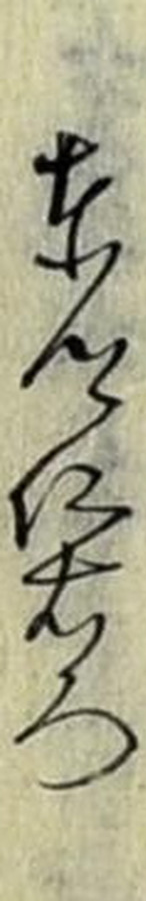覚東郷仁右衛門
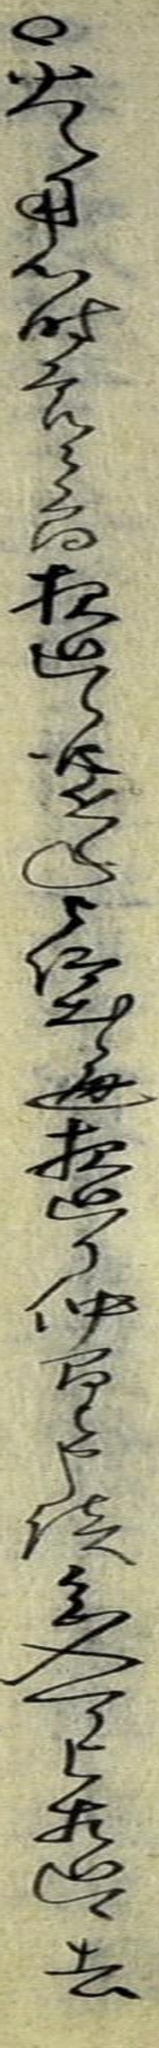〇火之用心時節ニ候間夜廻之儀近年被仰出候通夜廻り仲間被申談念入可被相廻候去
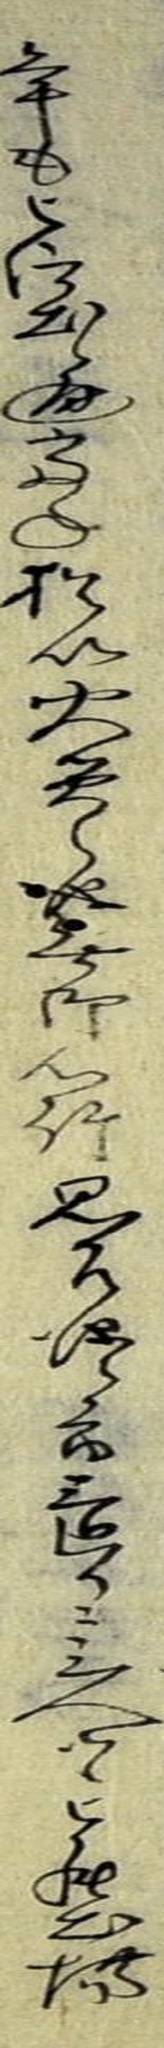年も被仰出候通当年猶以火災之儀無御心許思召儀ニ候間三廻りニ三人ツヽ被罷出場
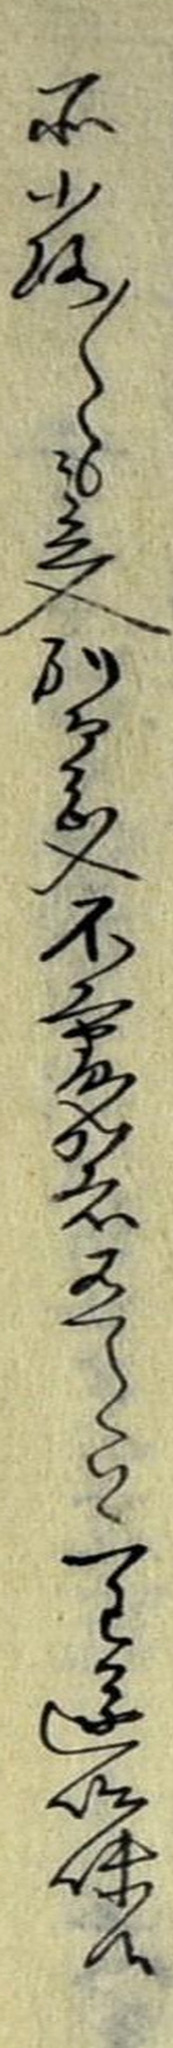所小路〳〵へも立入別而念入不審成者有之候ハヽ可被遂吟味候

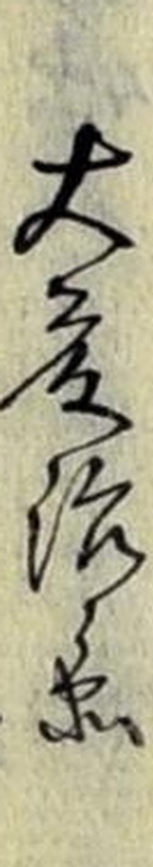大藤治兵衛
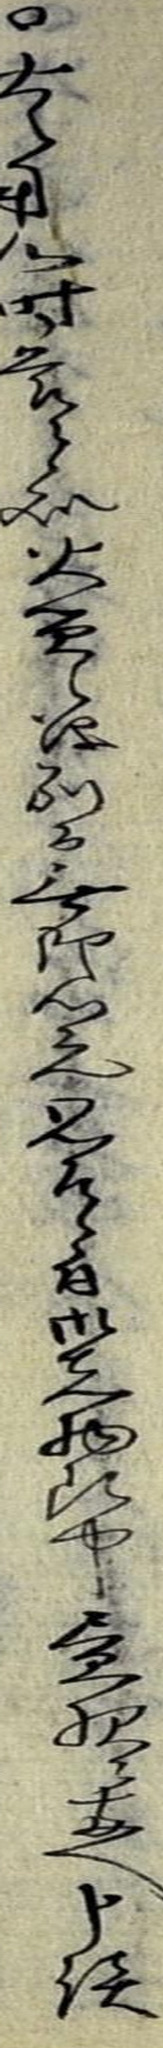〇火之用心時節ニ候処火災之儀別而無御心元思召候ニ付御先物頭中昼夜ニ両人申談
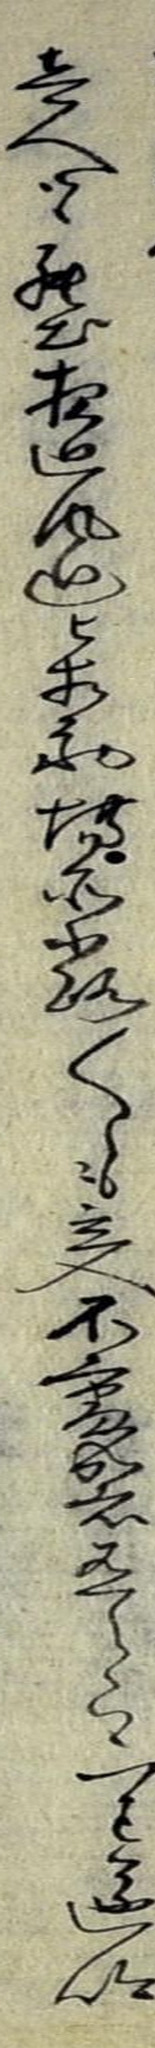壱人ツヽ罷出夜廻風廻被相勤場所小路〳〵へも立入不審成者有之候ハヽ可被遂吟
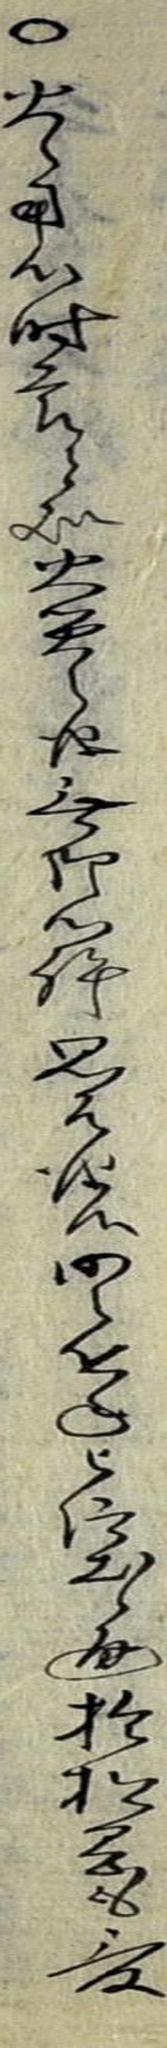〇火之用心時節ニ候処火災之儀無御心許思召儀候仍之近年被仰出候通於松岡も爰
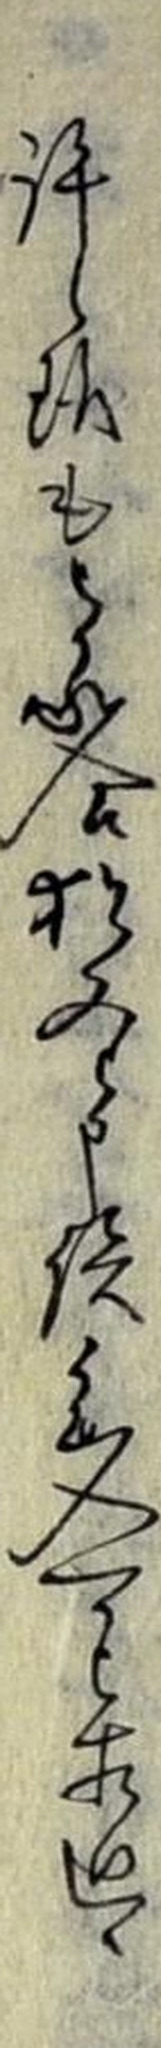許之趣も被承合猶又被申談念入可被相廻候
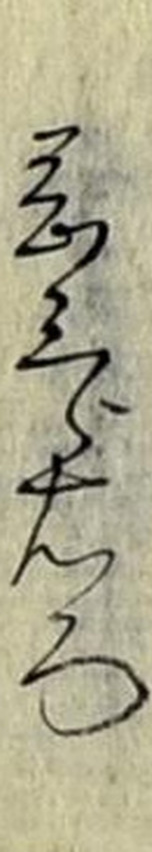岡三郎右衛門
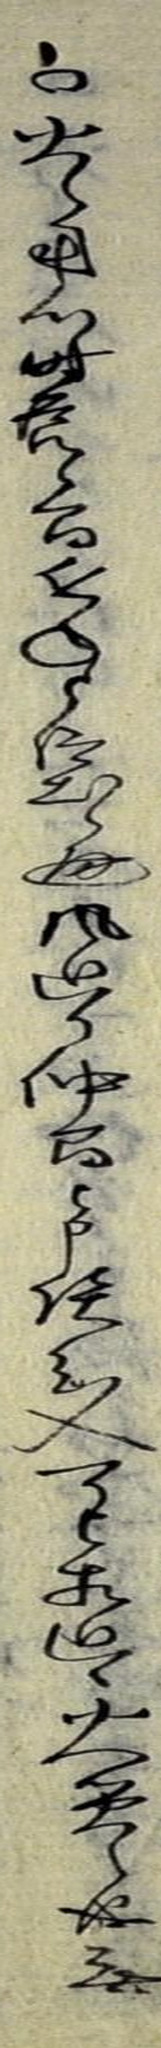〇火之用心時節ニ候間近年被仰出候通風廻り仲間被申談念入可被相廻候火災之儀無
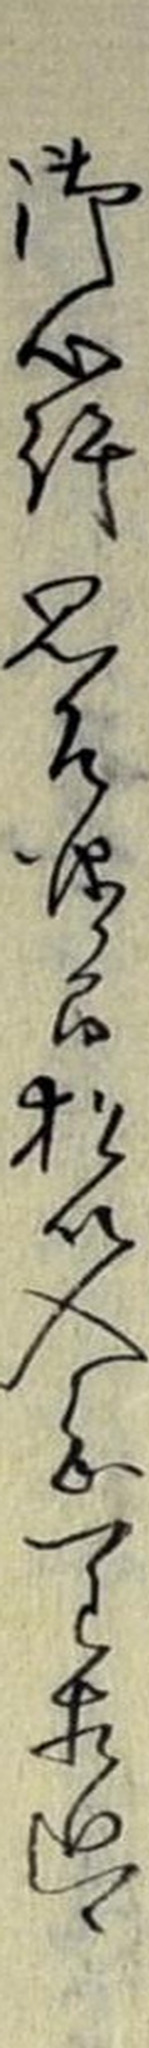御心許思召儀候間猶以入念可被相廻候
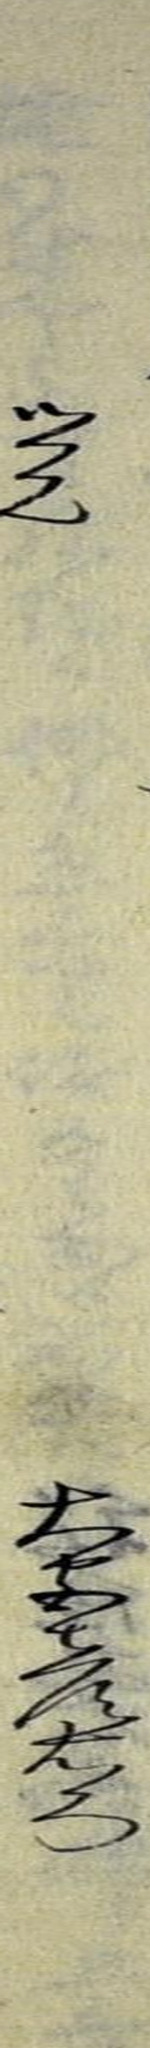覚大宮彦右衛門
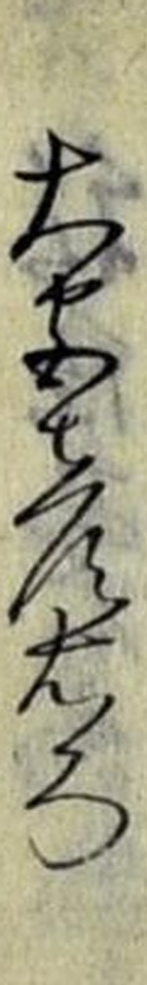覚大宮彦右衛門
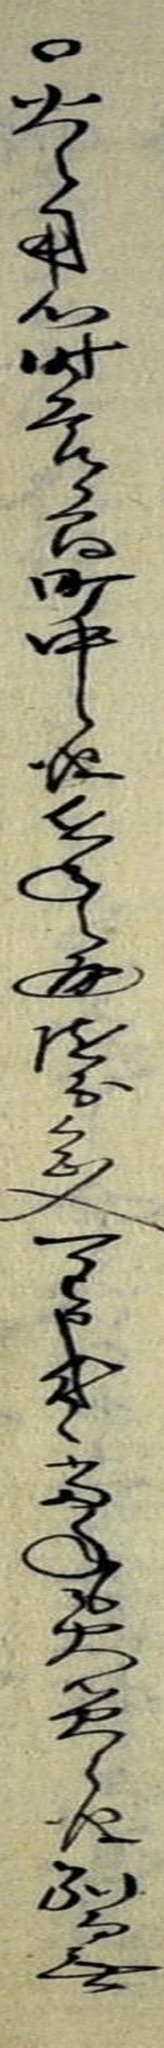〇火之用心時節候間町中之儀近年之通随分念入可被申付候当年も火災之儀別而無
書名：命令之部 一
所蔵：福井県文書館 Fukui Prefectural Archives
